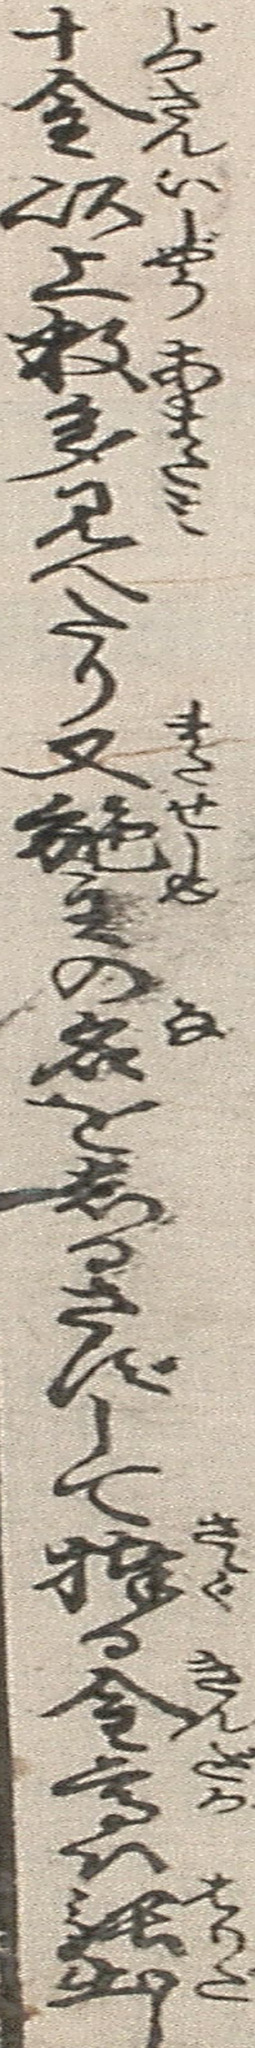十金以上数多見へたり又施主の名をしるさずして推る金高ハ張出し
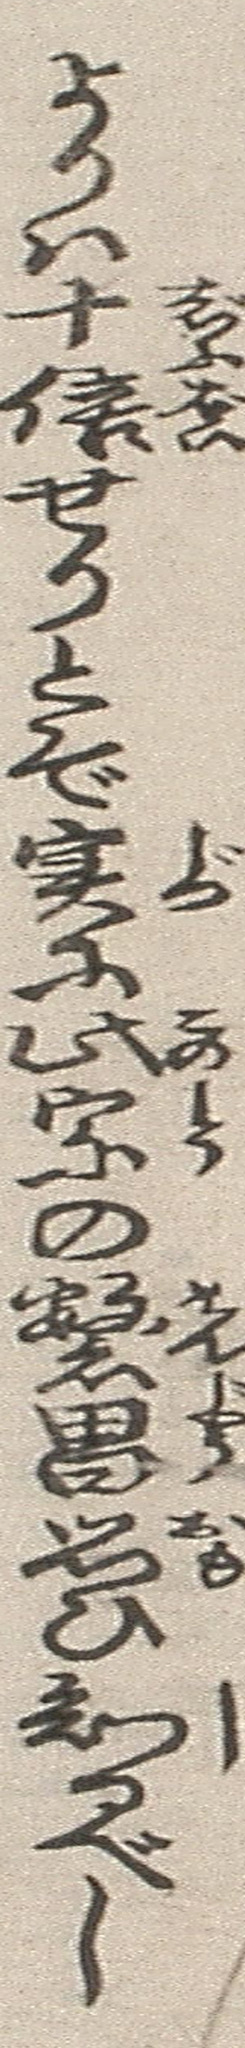よりハ十倍せりとぞ実に此宗の繁昌思ひ知るべし
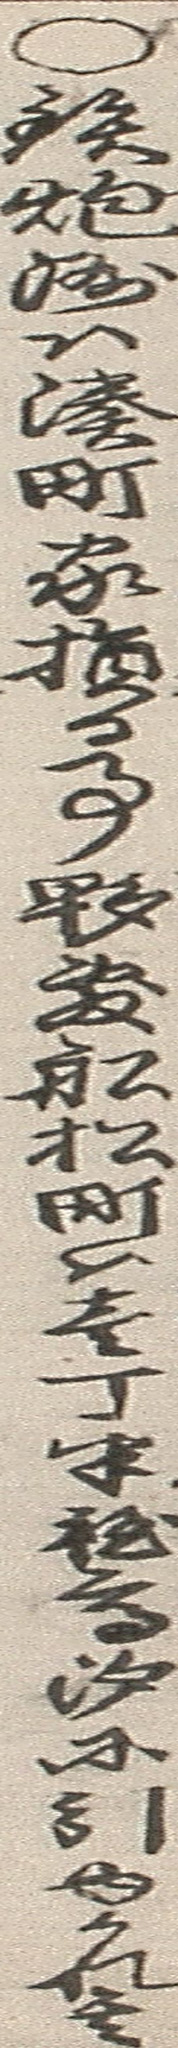◯鉄炮洲ハ湊町家損る事夥敷船松町ハ壱丁半程高汐に引ゆかれ其
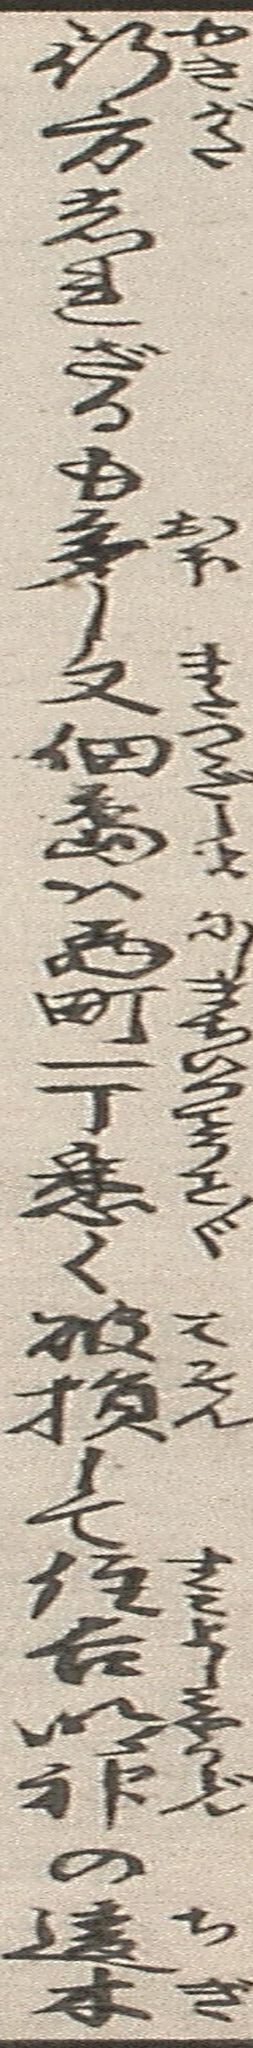行方しらざるも多し又佃嶋ハ西町一丁悉く破損して住吉明神の違木
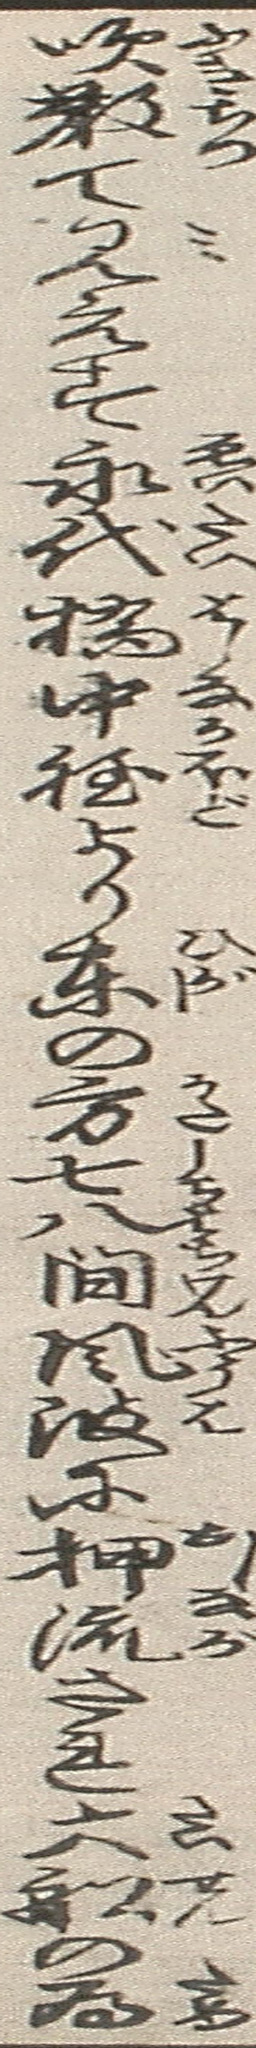吹散て見えず永代橋中程より東の方七八間風破に押流され大船の為
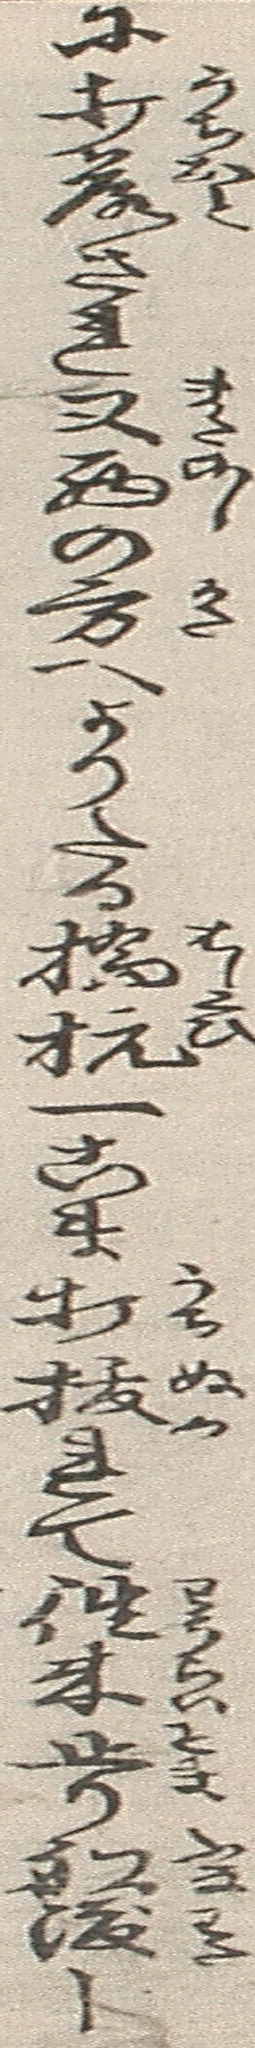に打落され又西の方へよりたる橋杭一こま打抜れて往来止り船渡し
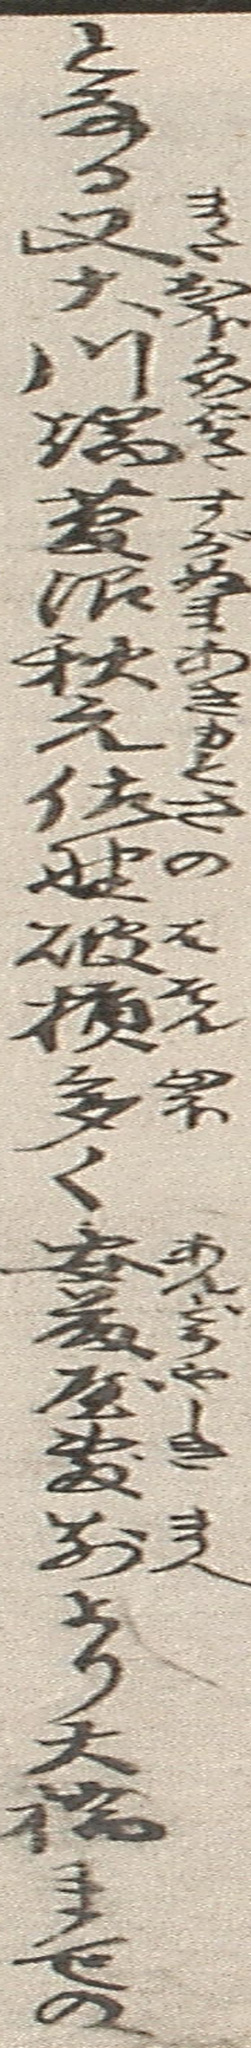となる又大川端菅沼秋元佐野破損多く安藤屋敷前より大橋までの
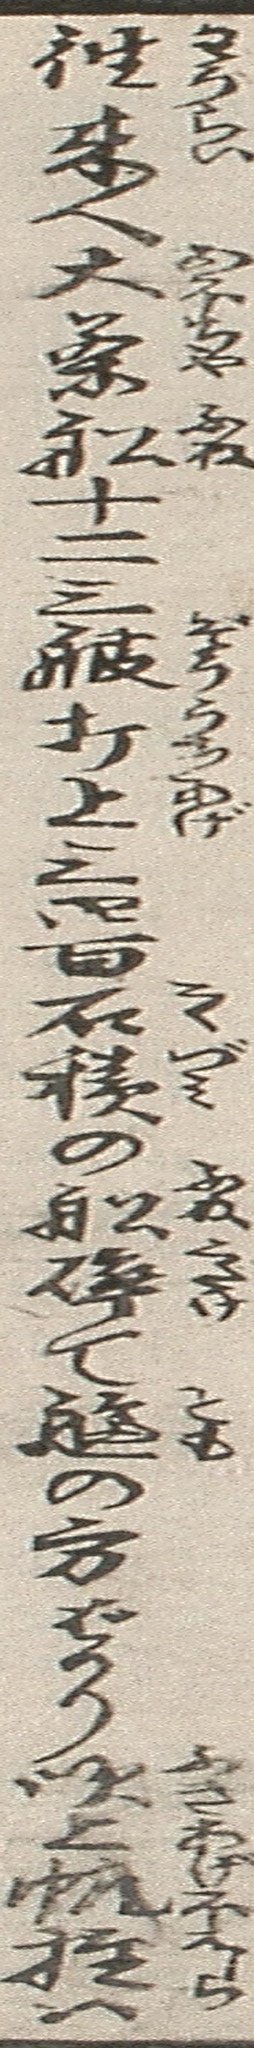往来へ大茶船十二三艘打上三四百石積の船砕て艫の方ばかり吹上帆柱ハ
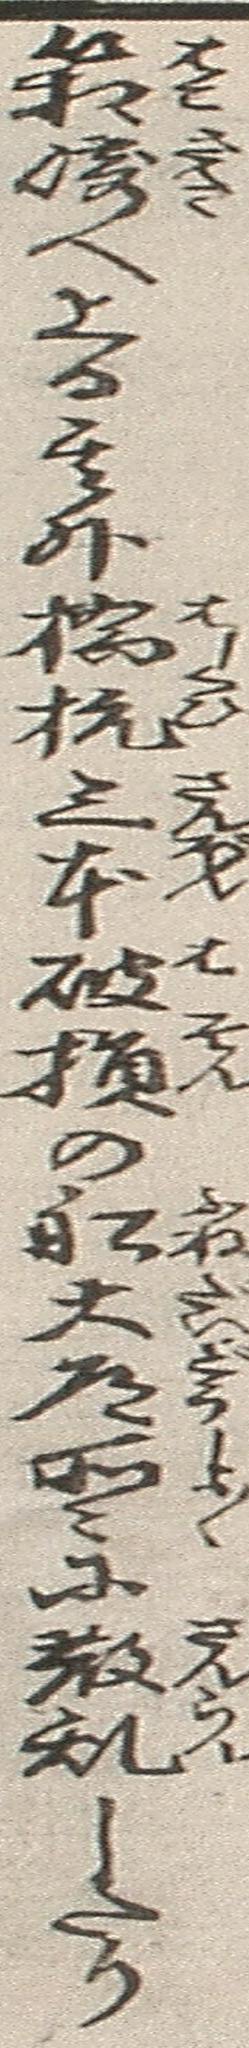箱崎へ上る其外橋杭三本破損の船大道所々に散乱したり
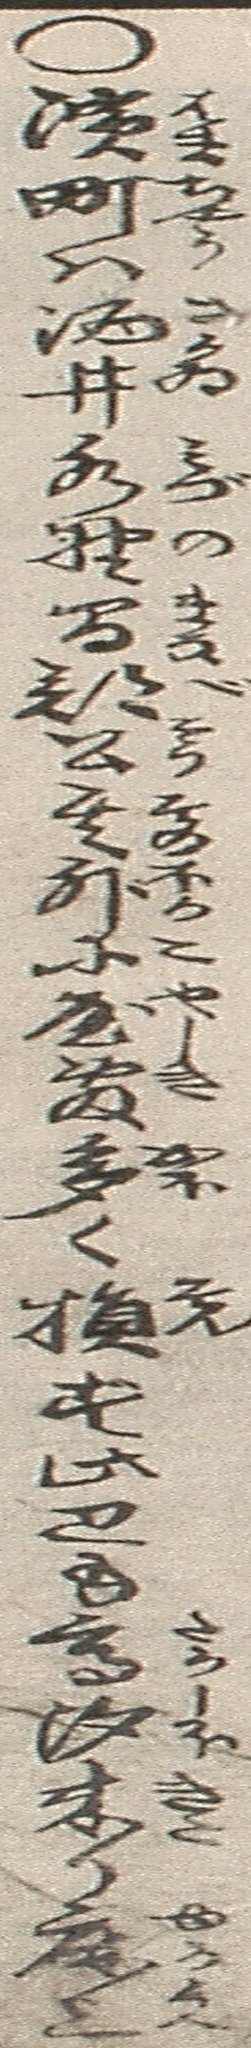◯浜町ハ酒井水野間部公其外小屋敷多く損す此辺も高汐来り床上
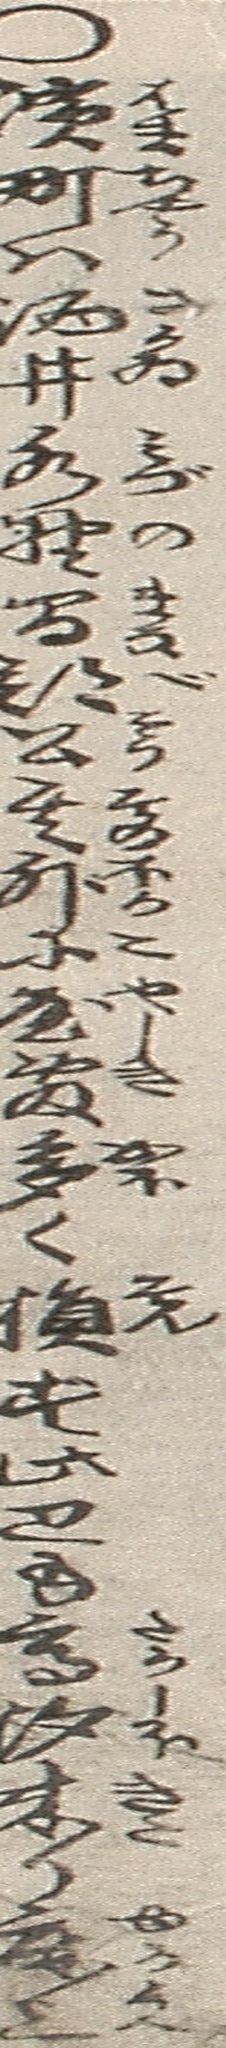◯浜町ハ酒井水野間部公其外小屋敷多く損す此辺も高汐来り床上
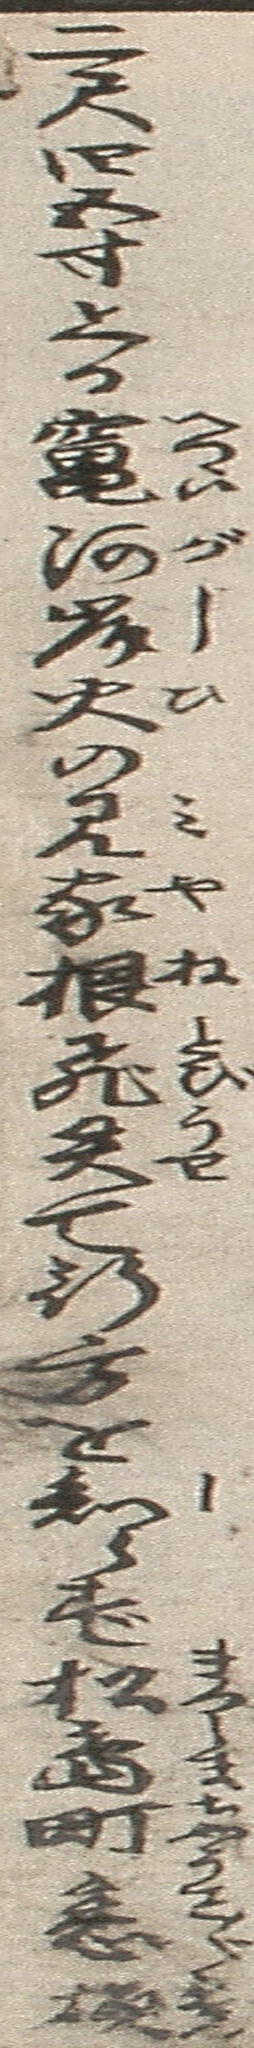二尺四五寸上る竈河岸火の見家根飛失て行方を知らず松嶋町悉損
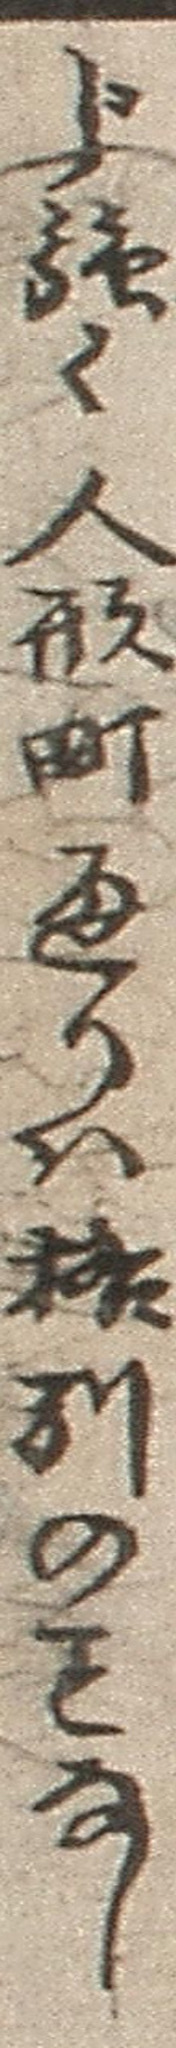じ強く人形町通りハ格別の事なし

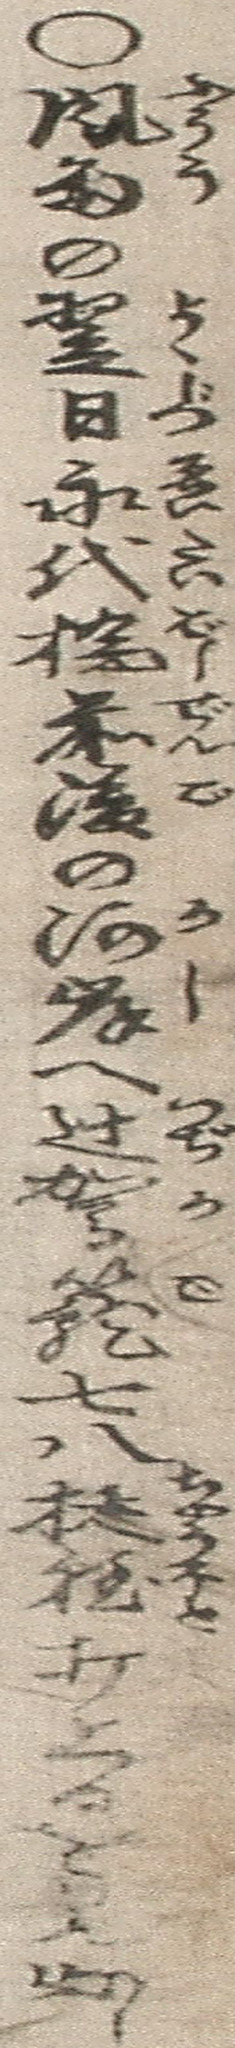◯風雨の翌日永代橋前後の河岸へ辻駕籠七八挺程打上るを見出し
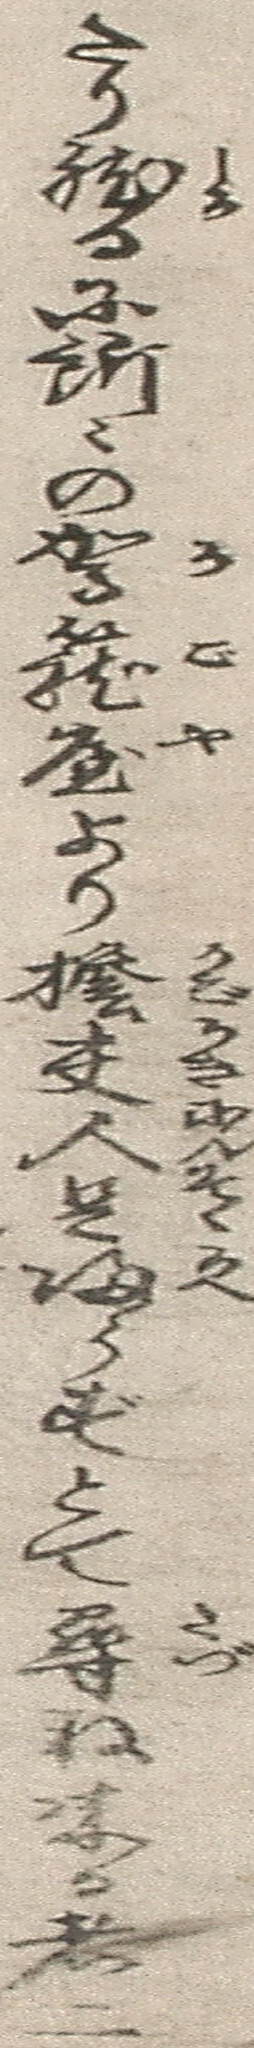たり然るに所々の駕籠屋より擔夫人足歸らずとて尋ね来る者二
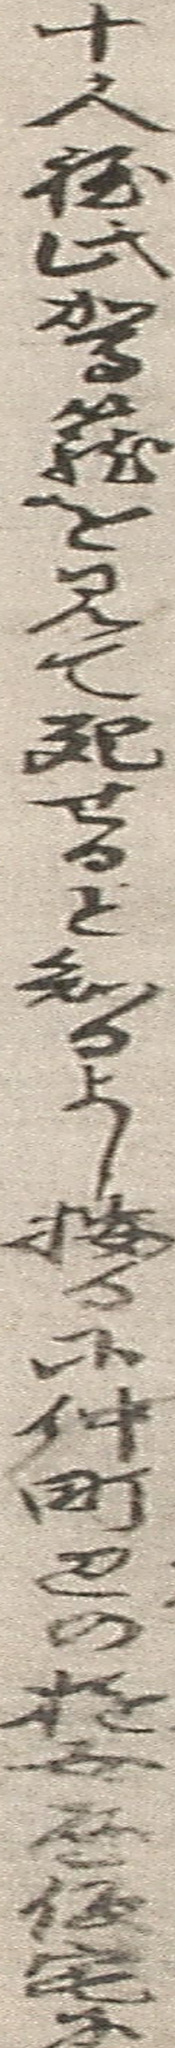十人程此駕籠を見て死せると知るよし按るに仲町辺の遊女屋仮宅に
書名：安政風聞集　上中下　全
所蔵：東京大学地震研究所図書室 Earthquake Research Institute Library, The University of Tokyo, JAPAN
